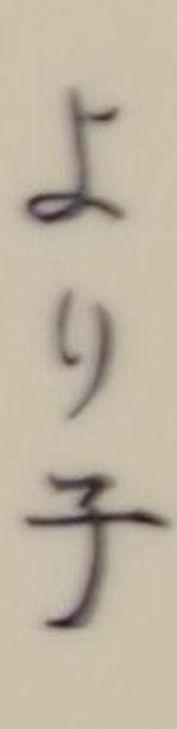より子
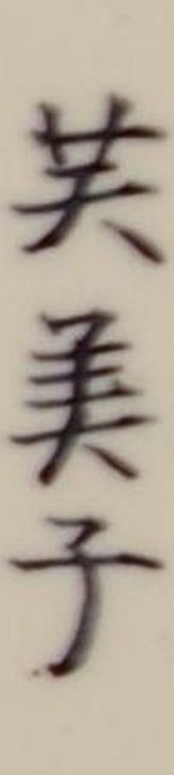芙美子
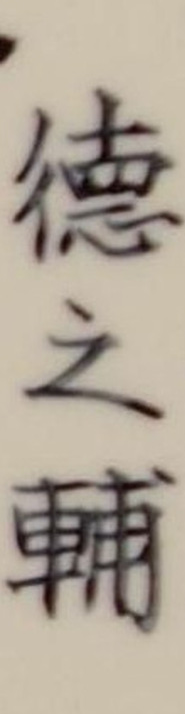徳之輔
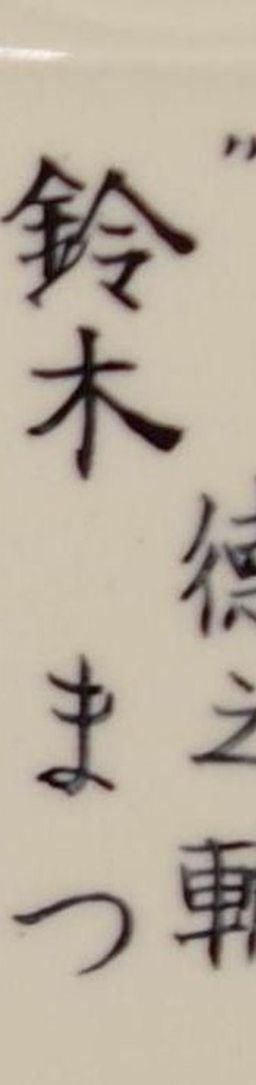鈴木まつ
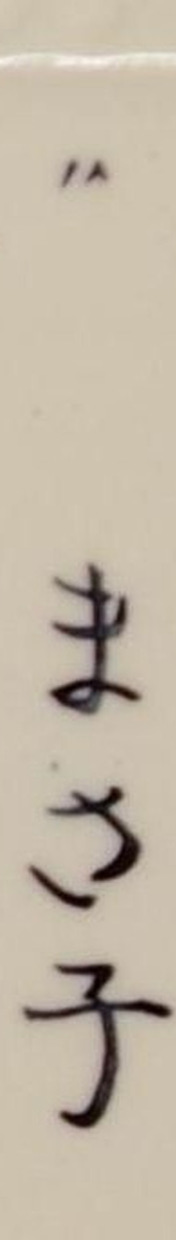まさ子
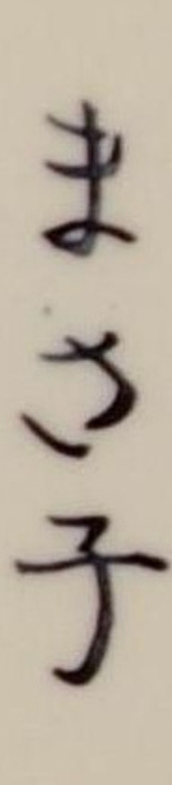まさ子
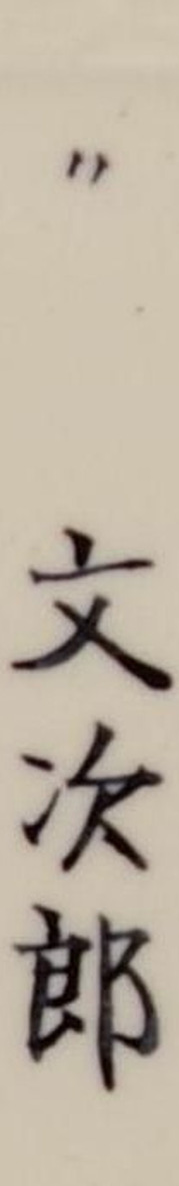文次郎
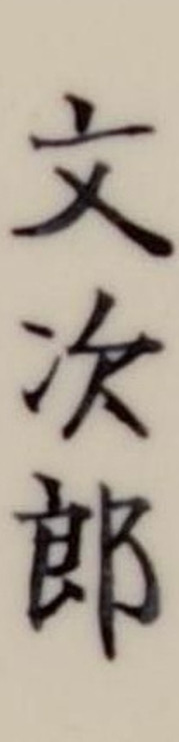文次郎
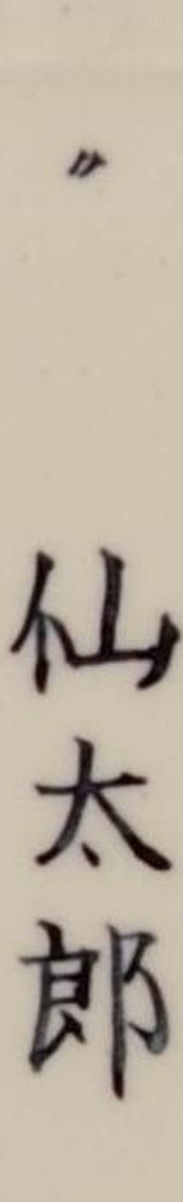仙太郎
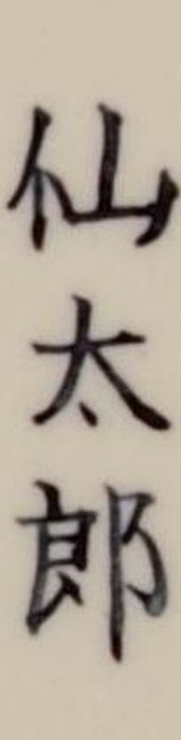仙太郎
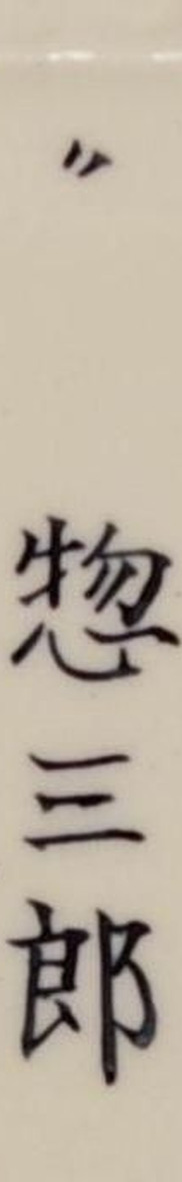惣三郎
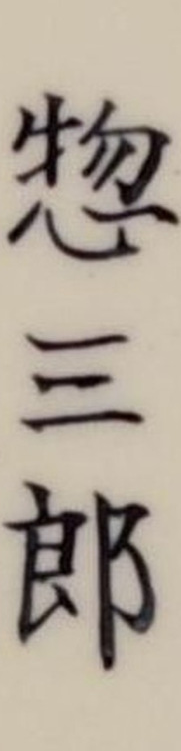惣三郎
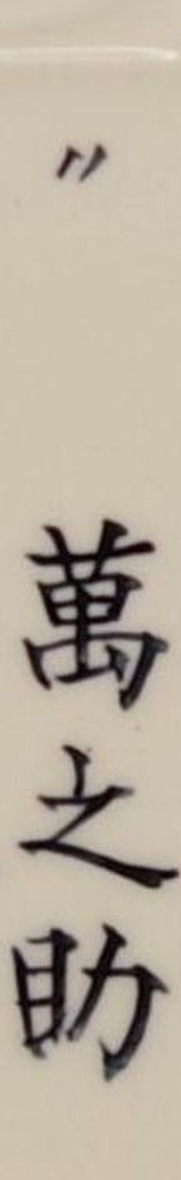萬之助
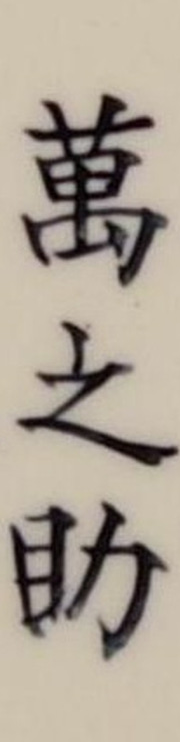萬之助
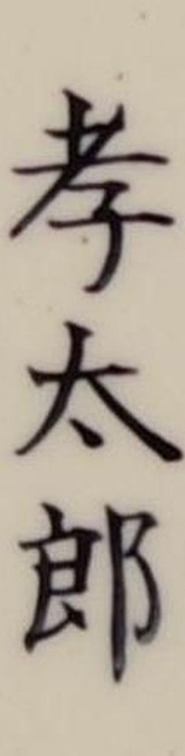孝太郎
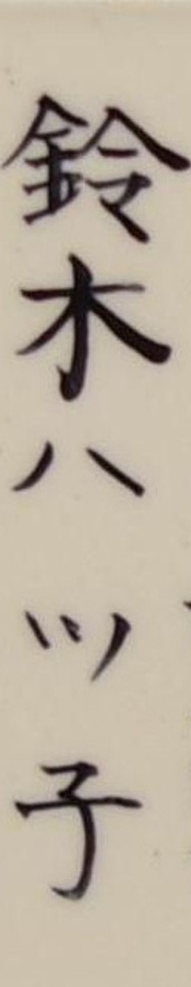鈴木ハツ子
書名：M~S
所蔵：高野山金剛峯寺
